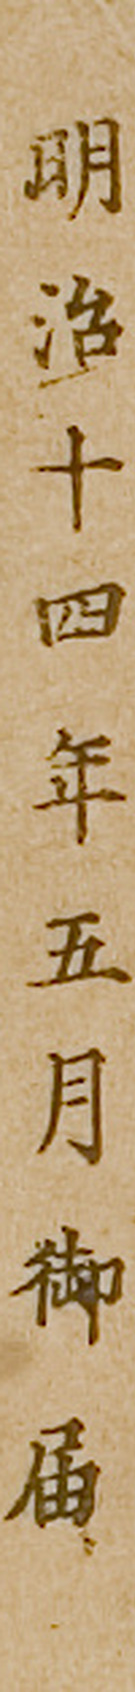明治十四年五月御届
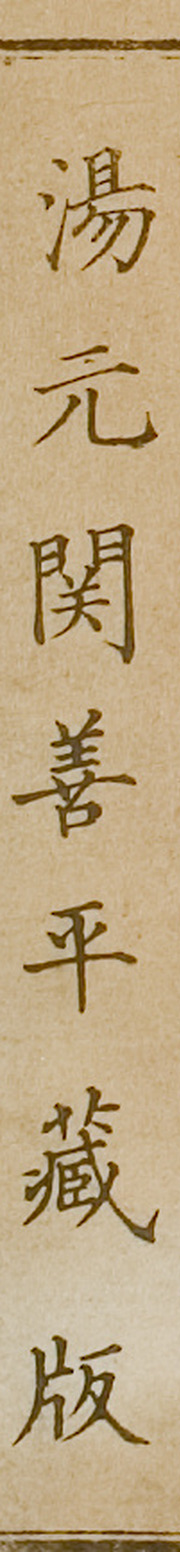湯元関善平蔵版
